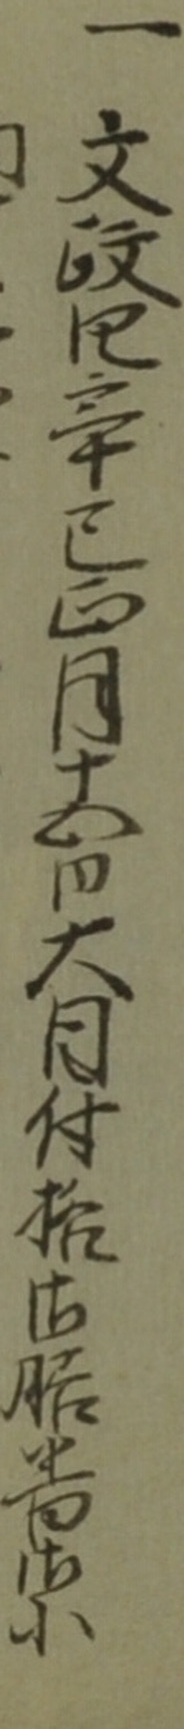一文政四辛巳正月十五日大目付格御膳番御小
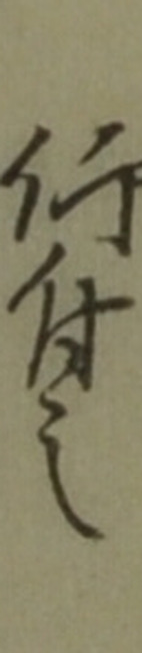仰付之
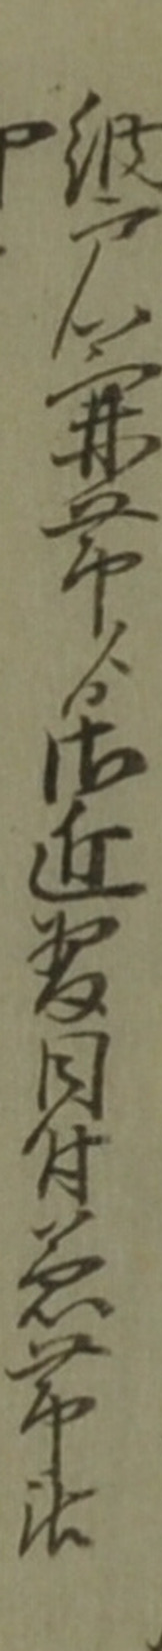納戸兼帯ゟ御近習目付兼帯被
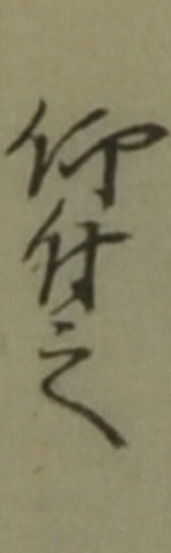仰付之
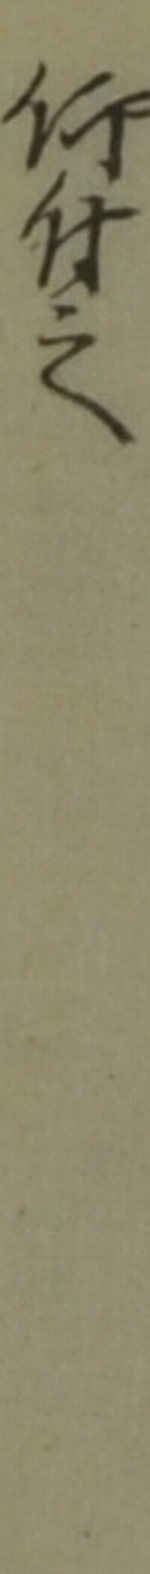仰付之
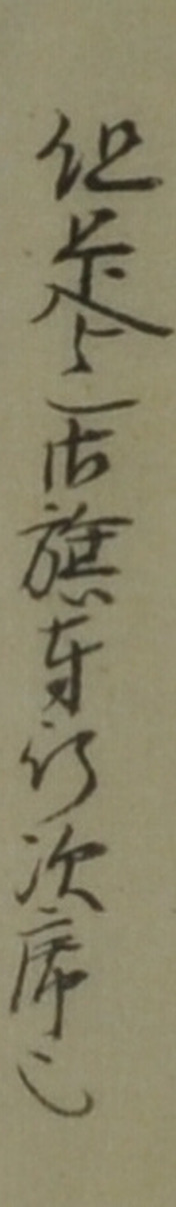但是迄御旗奉行次席也
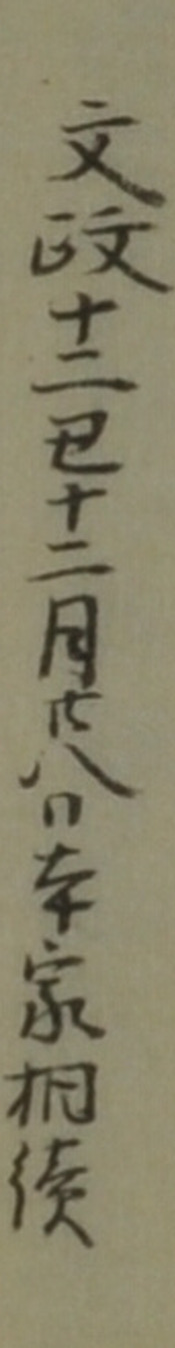文政十二丑十二月廿八日本家相続
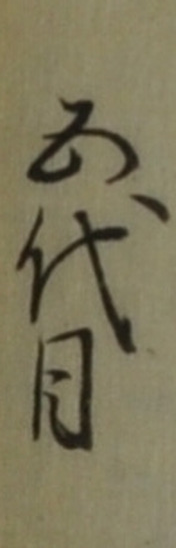五代目
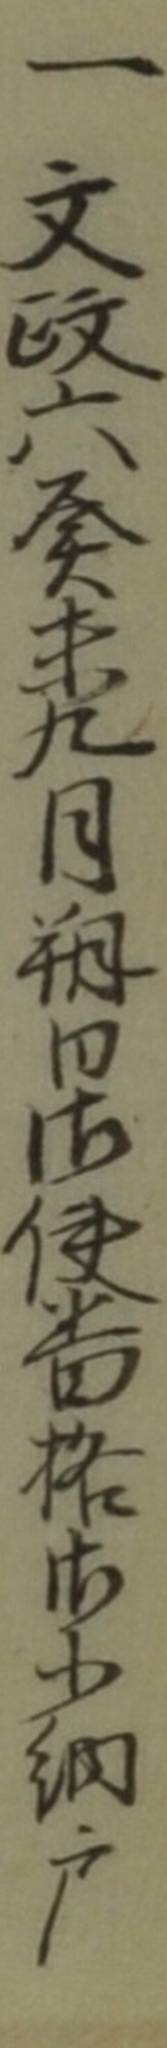一文政六癸未九月朔日御使番格御小納戸
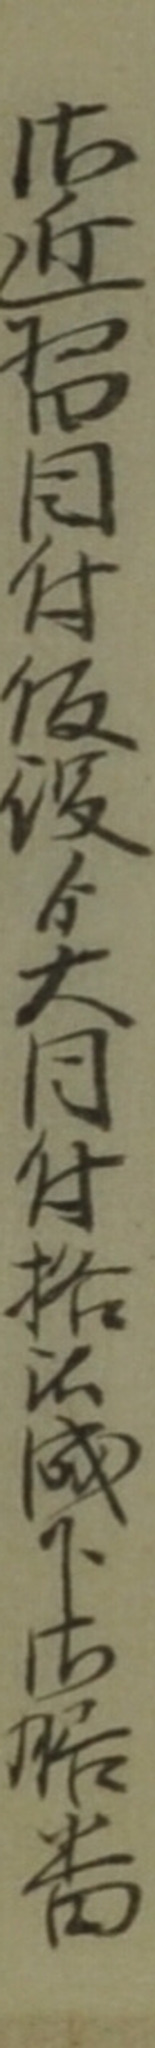御近習目付仮役ゟ大目付格被成下御膳番
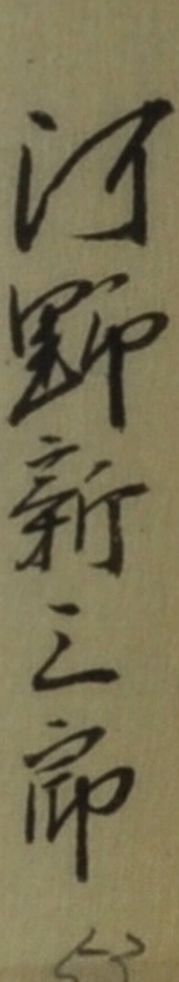河野新三郎
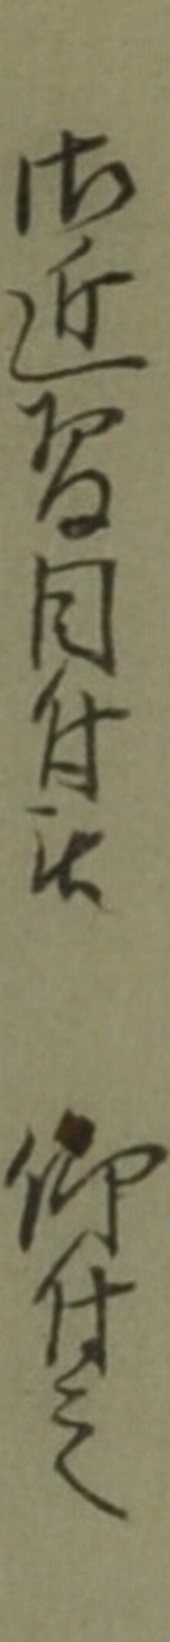御近習目付被仰付之
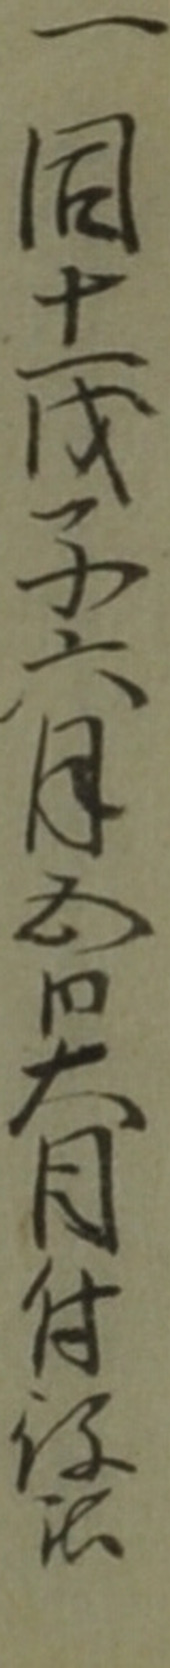一同十一戊子六月五日大目付役被
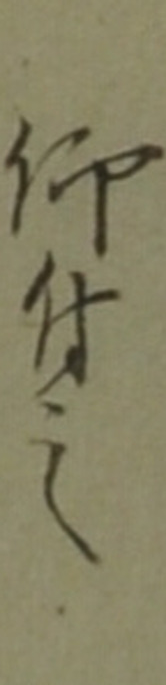仰付之
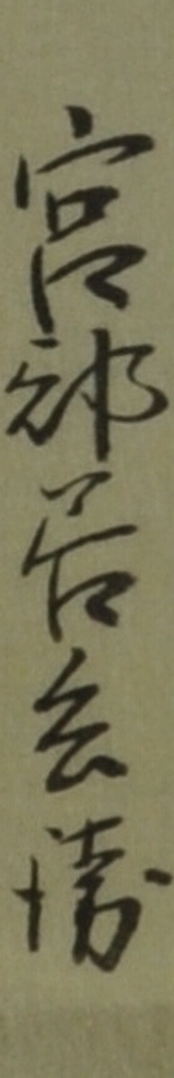宮部善兵衛
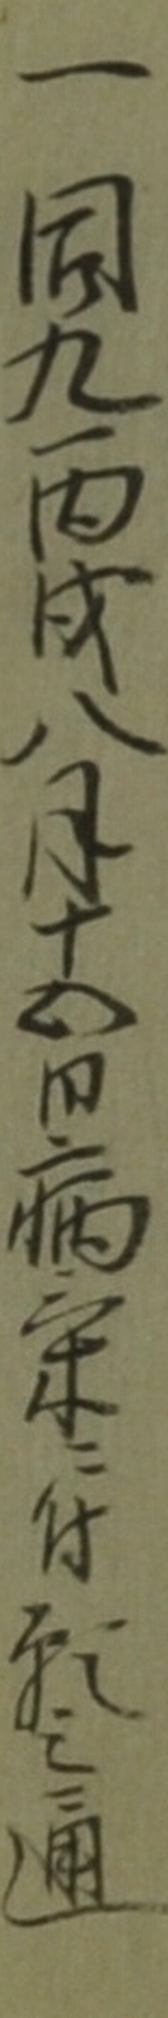一同九丙戌八月じ十五日病気ニ付願之通
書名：諸御役代々録（四）
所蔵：伊那市立高遠町図書館・合同会社AMANE
